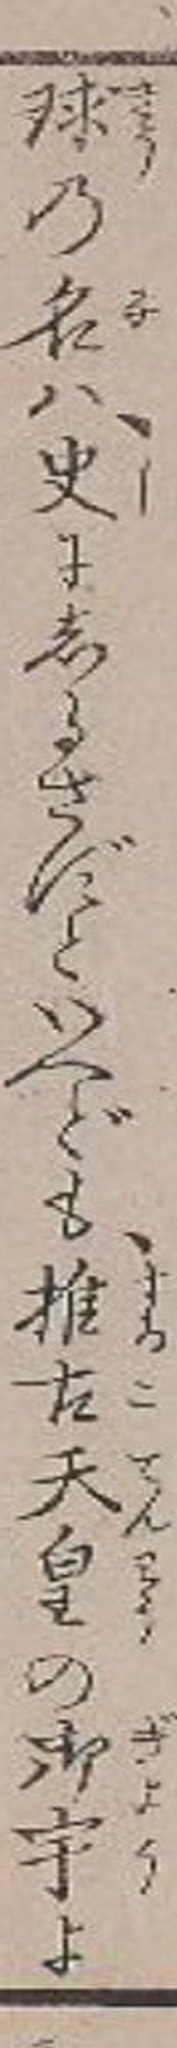球の名は、史にしるさずといへども、推古天皇の御宇よ
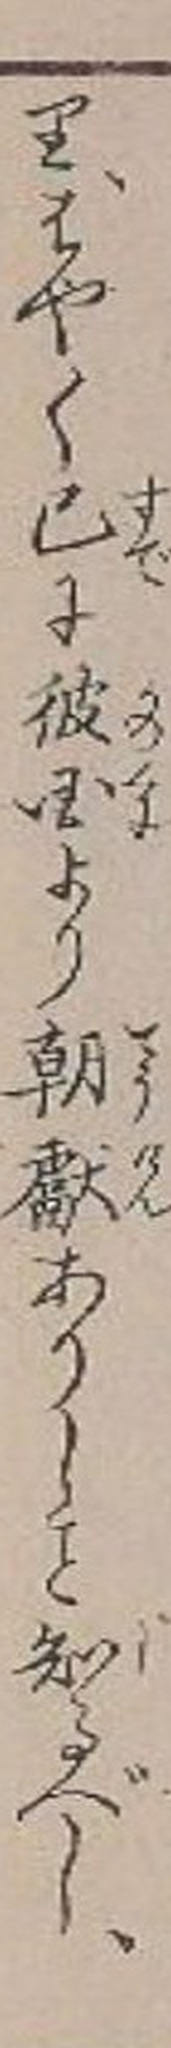り、はやく已に彼国より朝献ありしこと知るべし、
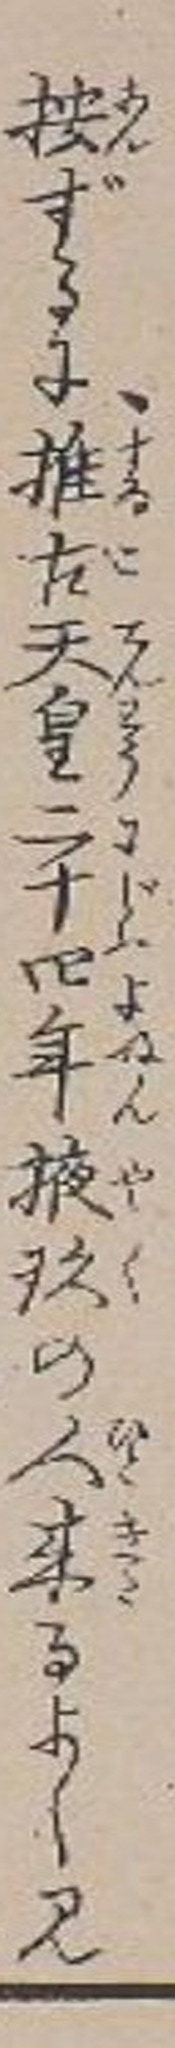按ずるに、推古天皇二十四年掖玖の人来るよし見
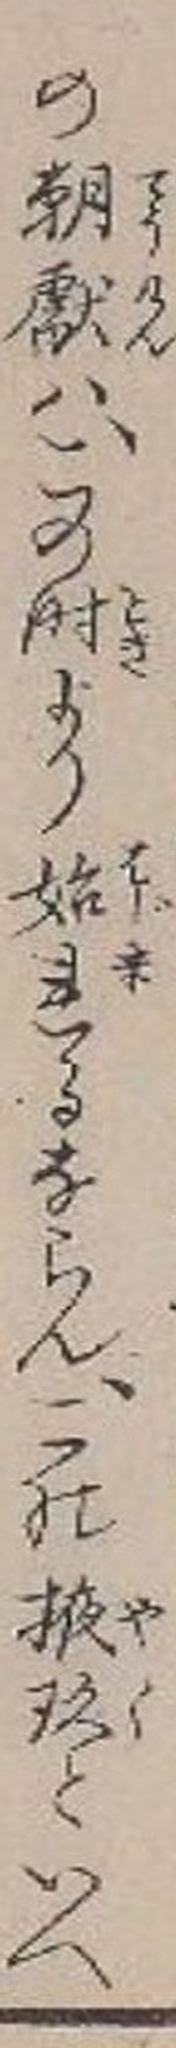の朝献は、この時より始れるならん、この掖玖といへ
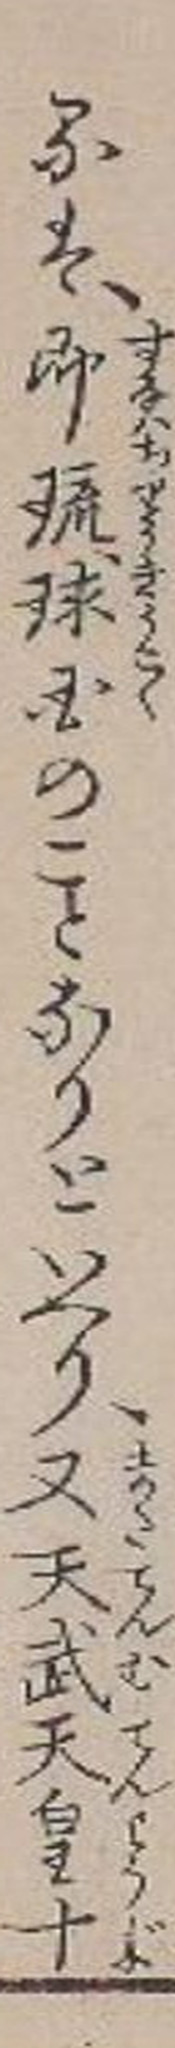るは、即琉球国のことなりといへり、又天武天皇十
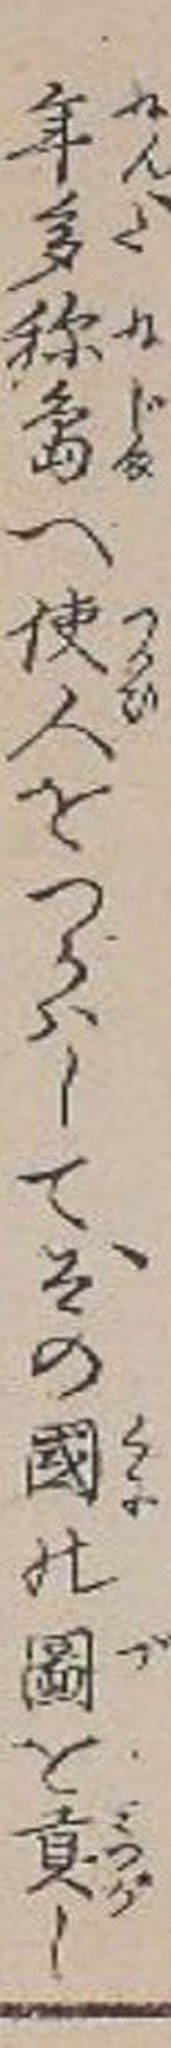年、多祢島へ使人をつかはして、その国の図を貢し
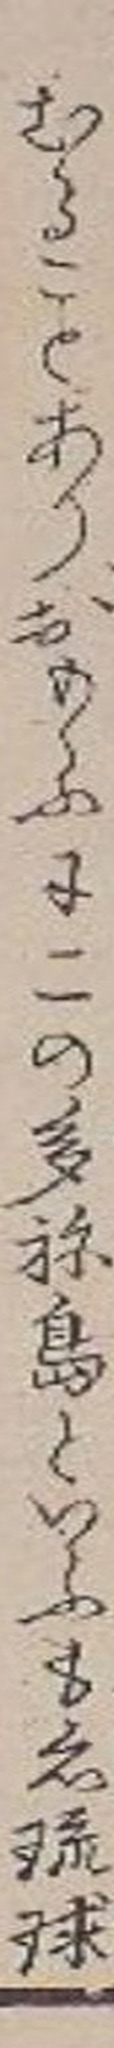むることあり、おもふにこの多祢島といふも、亦琉球
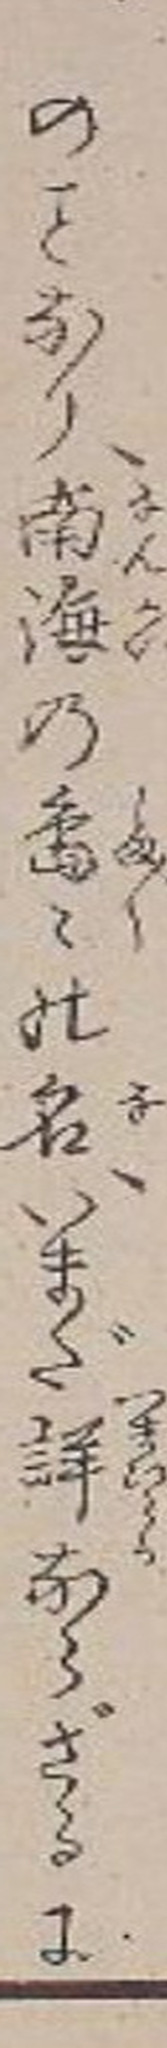のことなり、南海の島々の名、いまだ詳ならざるに
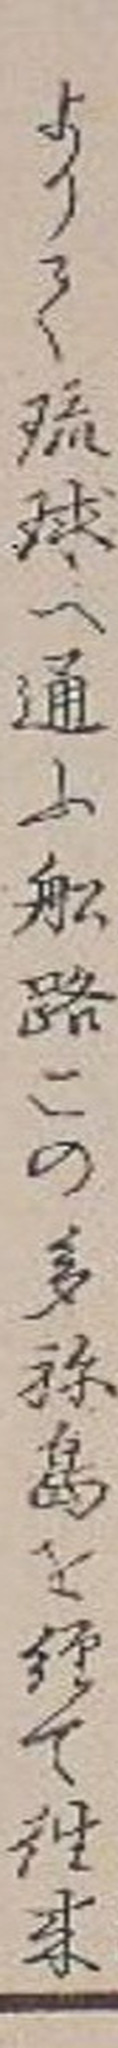よりて、琉球へ通ふ船路この多祢島を経て、往来
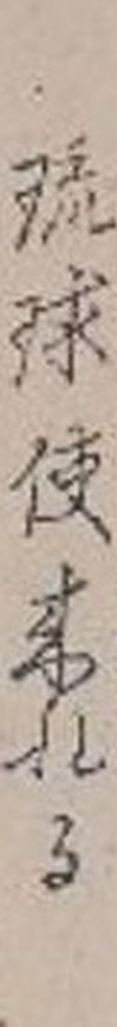琉球使来れる
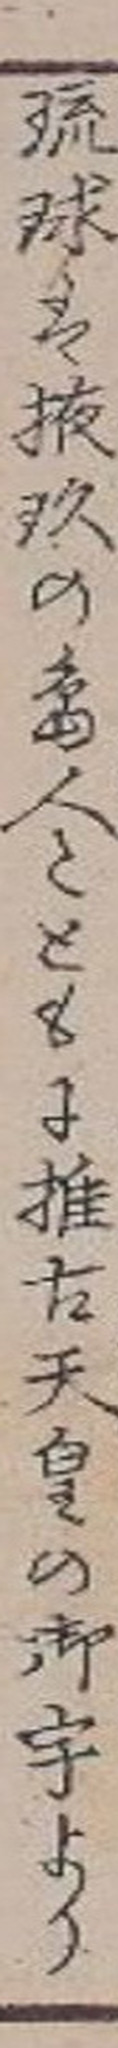琉球は掖玖の島人とともに、推古天皇の御宇より
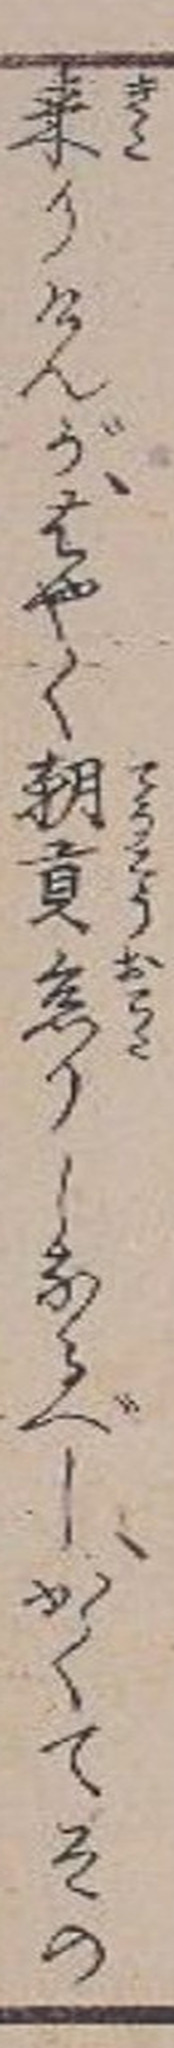来りけんが、はやく朝貢怠りしなるべし、かくてその

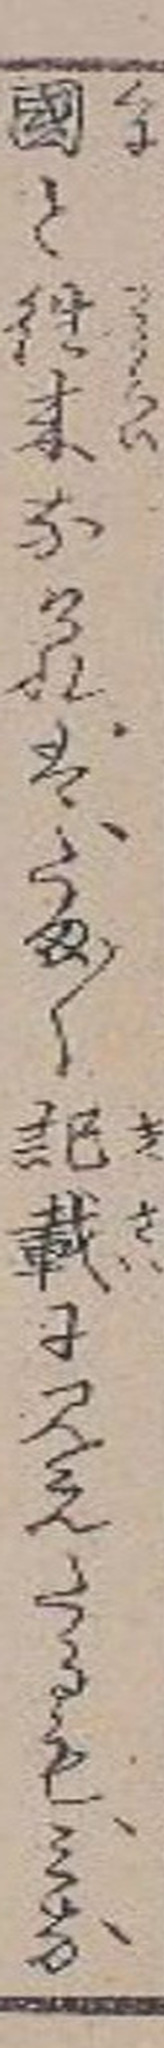国と往来なければ、たま〳〵記載に見えたるも、みな
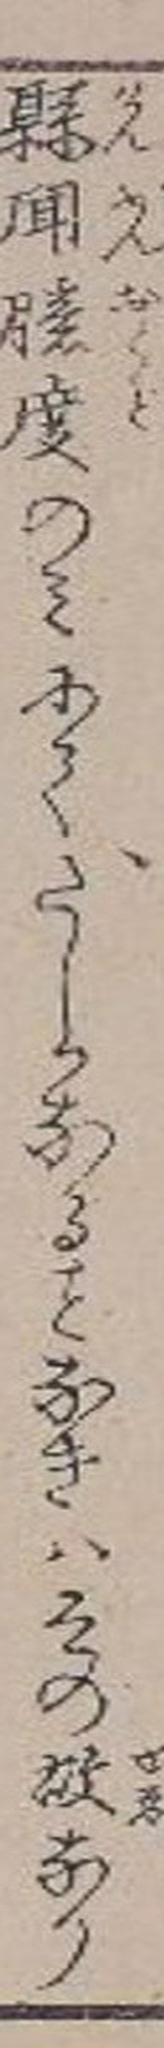県聞臆度のみにて、たしかなることなきはその故なり
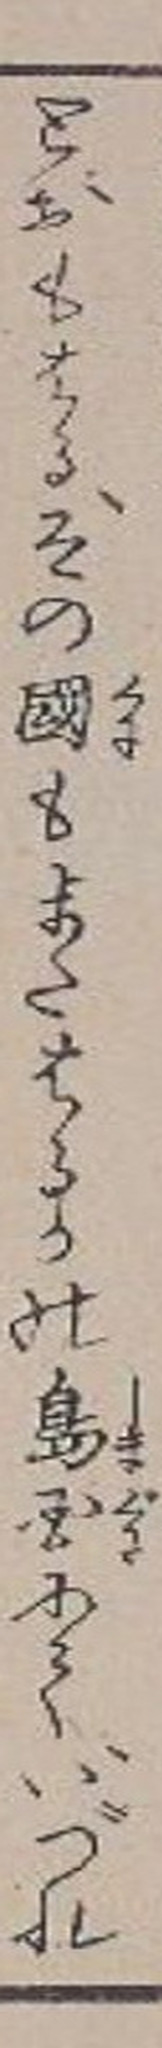とおもはる、その国もまたはるかの島国にて、いづれ
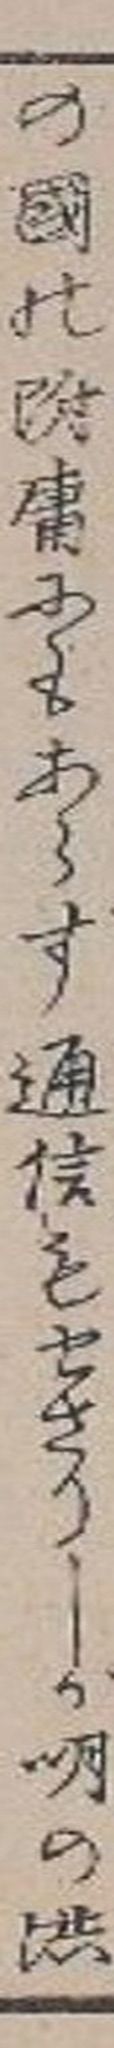の国の附庸にもあらず通信もせざりしが、明の洪
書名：琉球入貢紀略
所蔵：University of the Ryukyus Library
